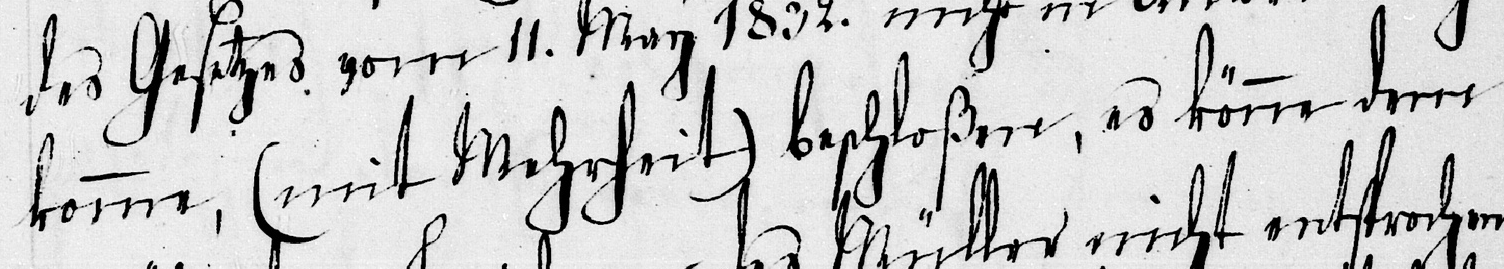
komme, (mit Mehrheit) beschloßen, es könne dem
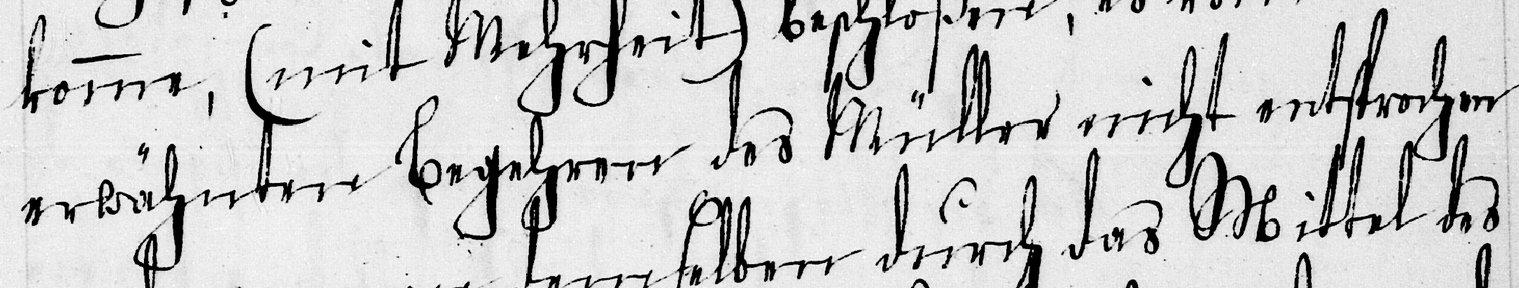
erwähnten Begehren des Müller nicht entsprochen
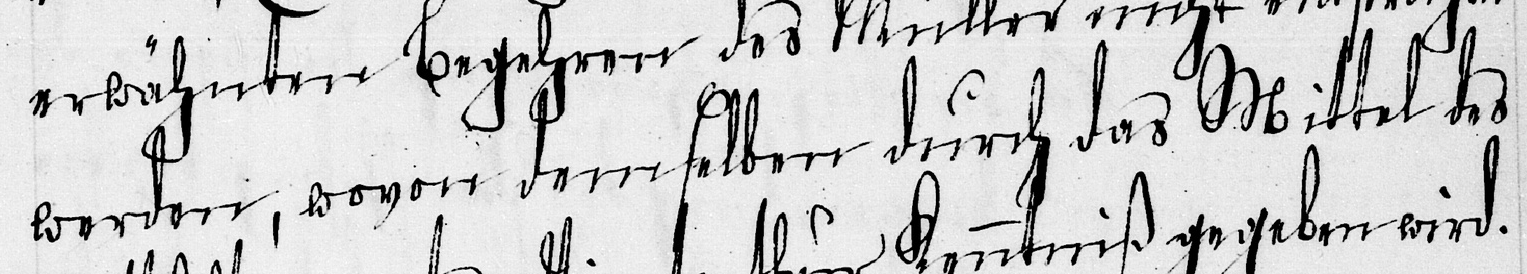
werden, wovon demselben durch das Mittel des
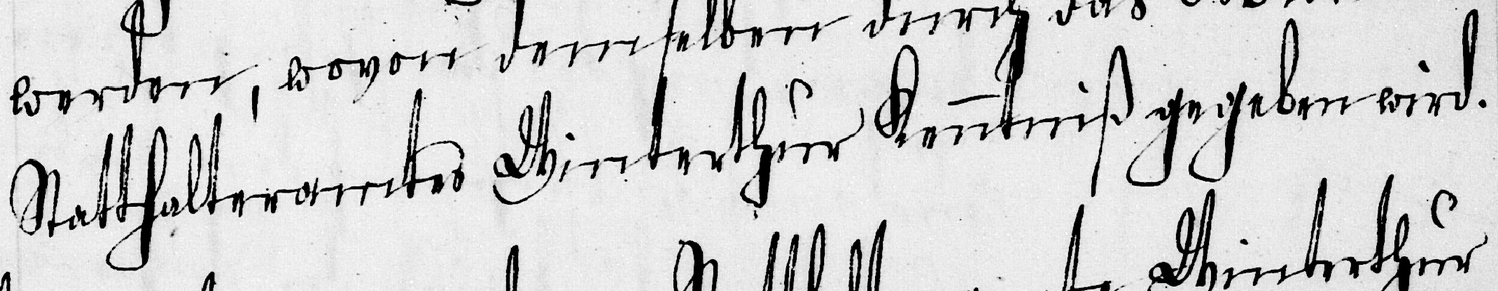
Statthalteramtes Winterthur Kenntniß gegeben wird.
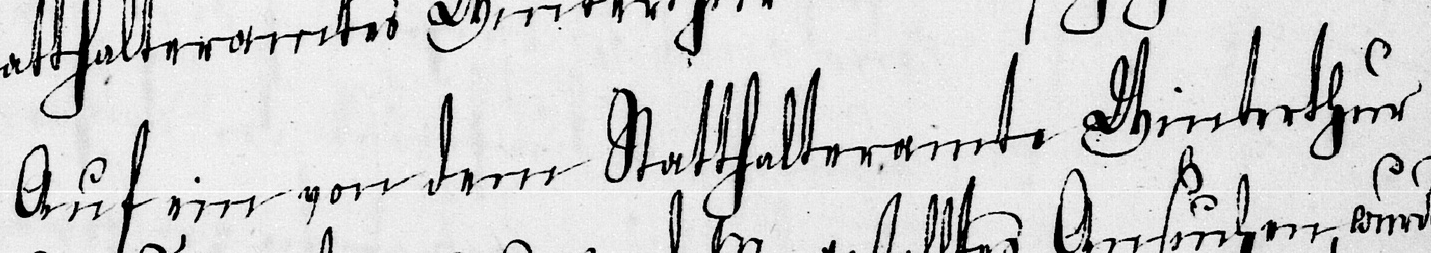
Auf ein von dem Statthalteramte Winterthu¬
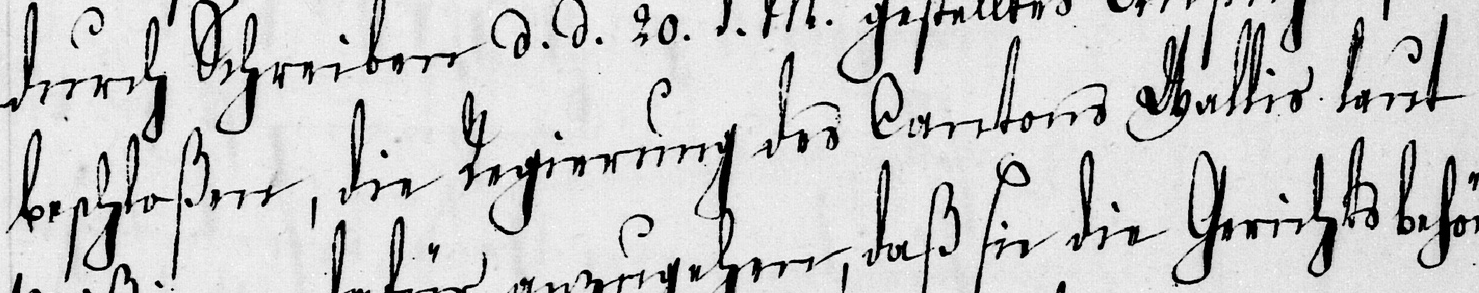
beschloßen, die Regierung des Cantons Wallis laut
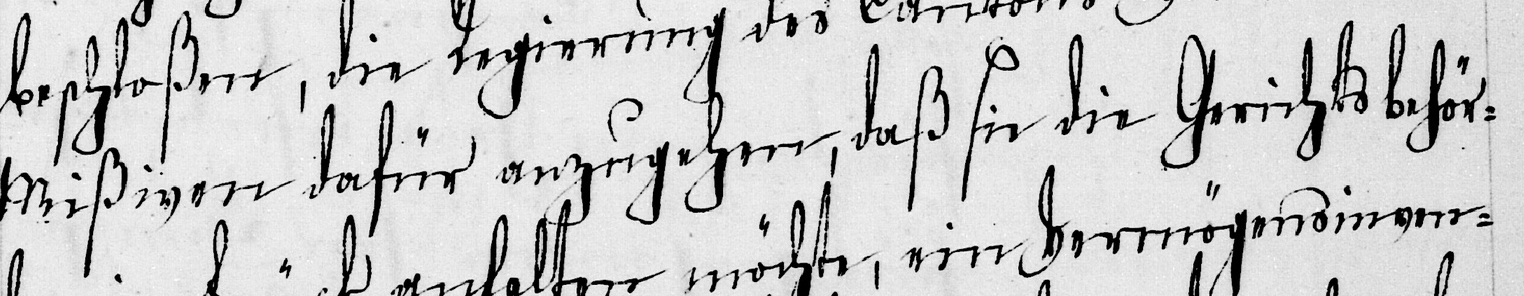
Mißiven dafür anzugehen, daß sie die Gerichtsbehörde
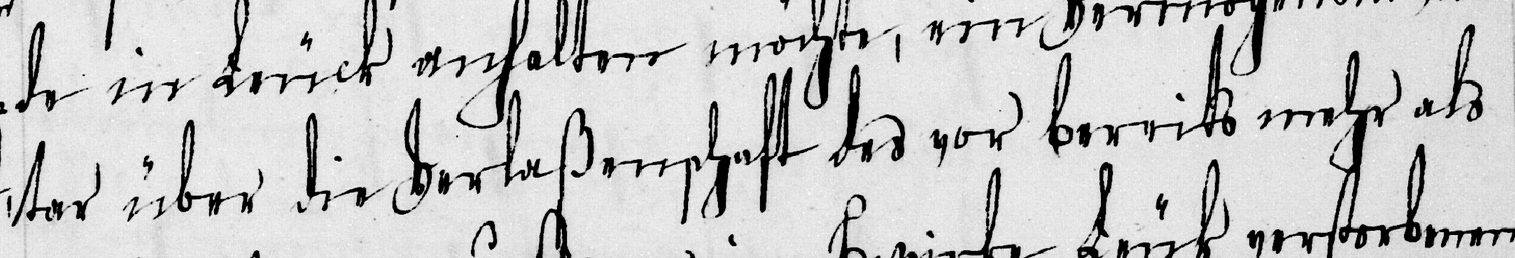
tar über die Verlaßenschaft des vor bereits mehr als
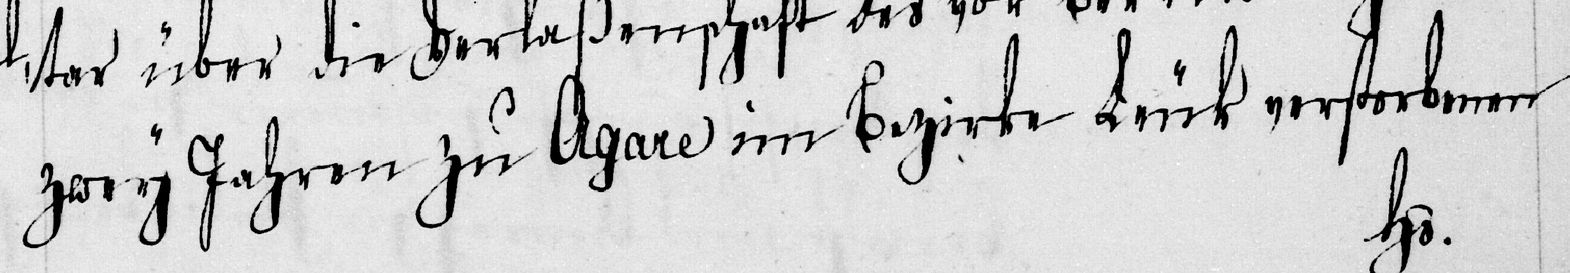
zwey Jahren zu Agare im Bezirke Leuk verstorbenen
